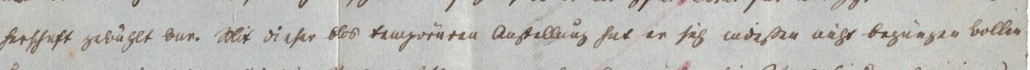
herschaft gewählt war. Mit dieser blos temporären Anstellung hat er sich indessen nicht begnügen wollen
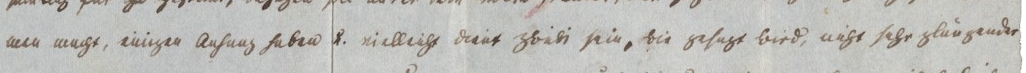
men macht, einigen Anhang haben u. vielleicht dient Zwicki sein, wie gesagt wird, nicht sehr glänzender
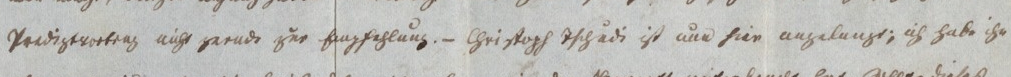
Predigtvortrag nicht gerade zur Empfehlung. – Christoph Tschudi ist nun hier angelangt; ich habe ihn
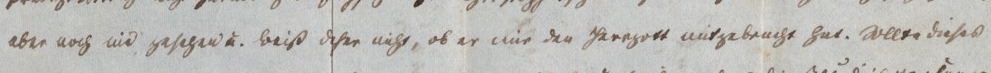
aber noch nie gesehen u. weiß daher nicht, ob er mir den Herrgott mitgebracht hat. Sollte dieses
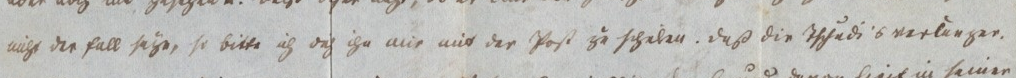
nicht der Fall seyn, so bitte ich dich ihn mir mit der Post zu schicken. Daß dir Tschudi's verlänger-
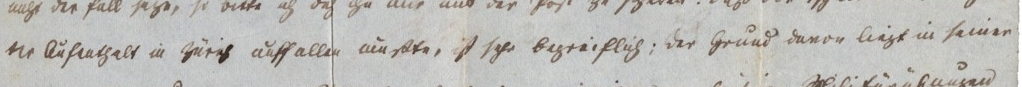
ter Aufenthalt in Zürich auffallen mußte, ist sehr begreiflich; der Grund davon liegt in seiner
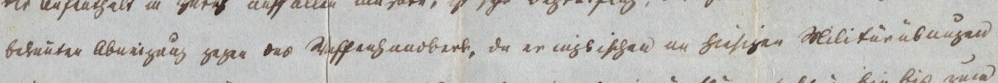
bekannten Abneigung gegen das Waffenhandwerk, da er inzwischen an hiesigen Militärübungen
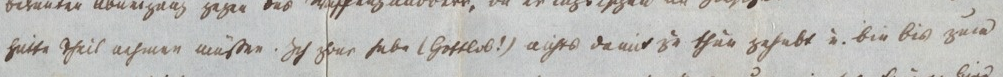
hätte Theil nehmen müssen. Ich zwar habe (Gottlob!) nichts damit zu thun gehabt u. bin bis zum
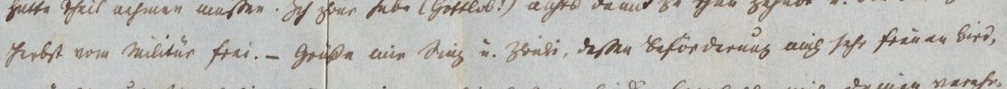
Herbst vom Militär frei. – Grüße mir Sinz u. Zwicki, dessen Beförderung mich sehr freuen wird,
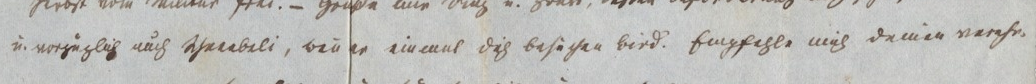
u. vorzüglich auch Schneebeli, wenn er einmal dich besuchen wird. Empfehle mich deinen verehr-
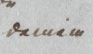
deinem
